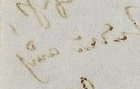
Juni 1853.
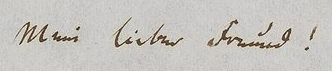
Mein lieber Freund!
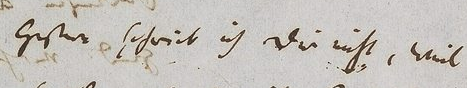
Gestern schrieb ich Dir nicht, weil
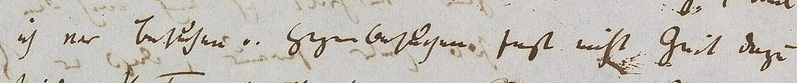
ich vor Besuchen &. Gegenbesuchen fast nicht Zeit dazu
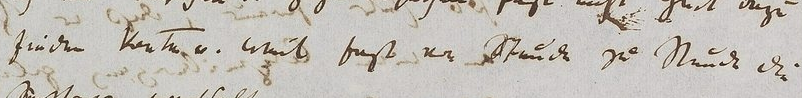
finden konnte &. weil fast von Stunde zu Stunde die
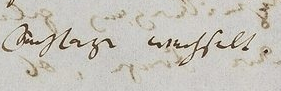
Sachlage wechselt.
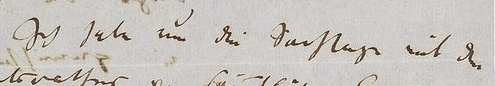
Ich habe nun die Sachlage mit den
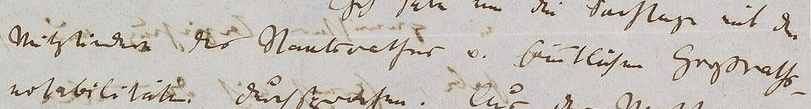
Mitgliedern des Staatsrathes &. sämmtlichen Großraths-
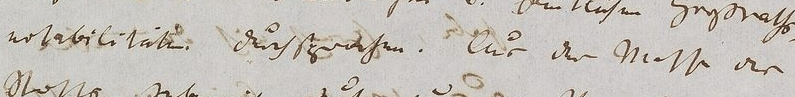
notabilitäten durchsprochen. Aus der Masse des
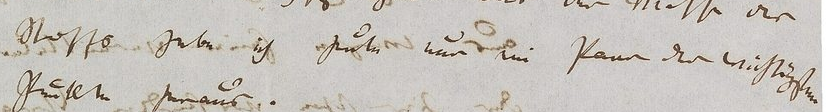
Stoffs hebe ich heute nur ein Paar der wichtigsten
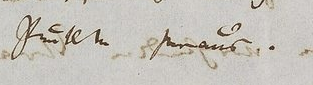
Punkte heraus.
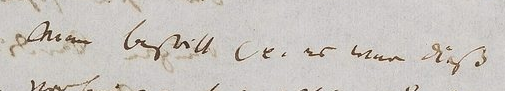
Man bestritt (&. es war dieß
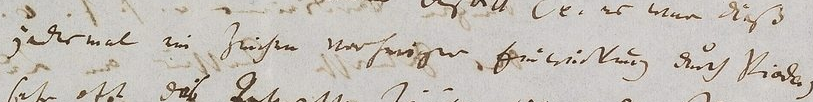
jedesmal ein Zeichen vorheriger Einwirkung durch Pioda )
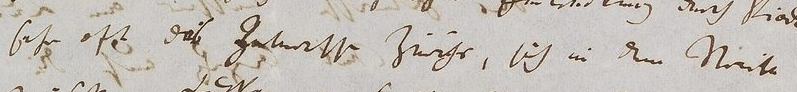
sehr oft das Interesse Zürichs, sich in dem Streite
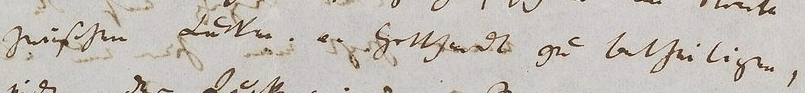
zwischen Luckm. und Gotthardt zu betheiligen,
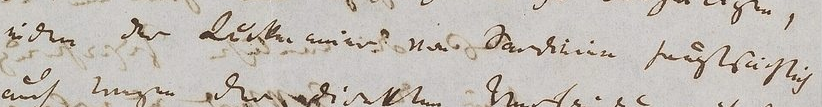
indem der Luckmanier von Sardinien hauptsächlich
